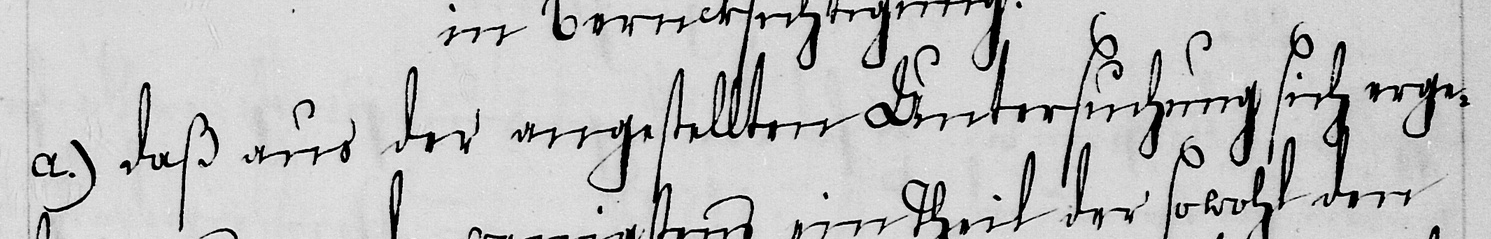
a.) daß aus der angestellten Untersuchung sich erge¬
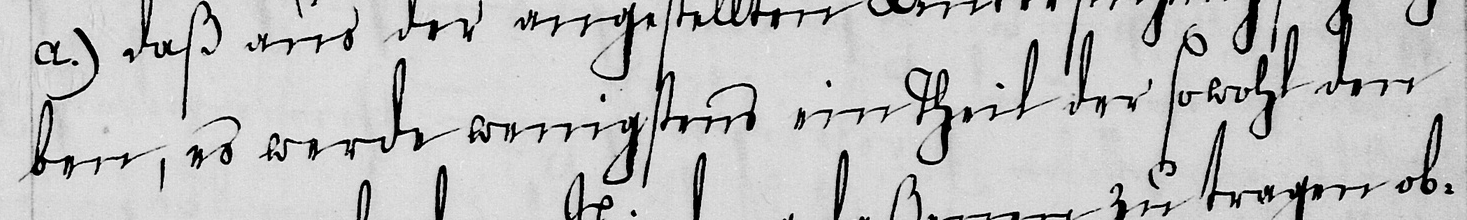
ben, es werde wenigstens ein Theil der sowohl den
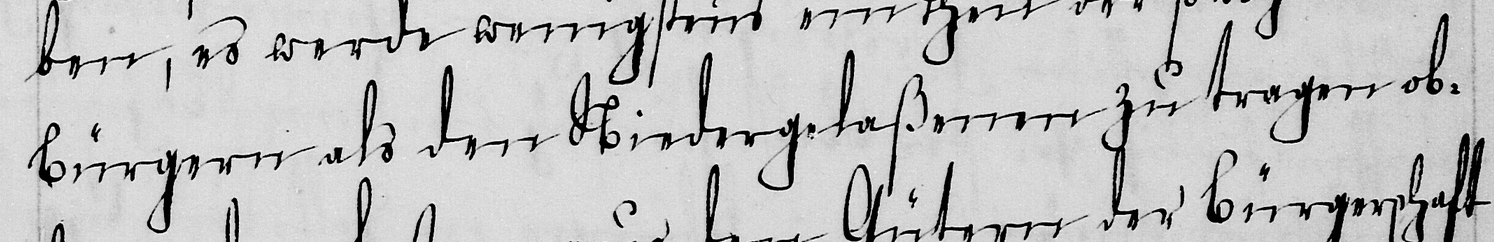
Bürgern als den Niedergelaßenen zu tragen ob¬
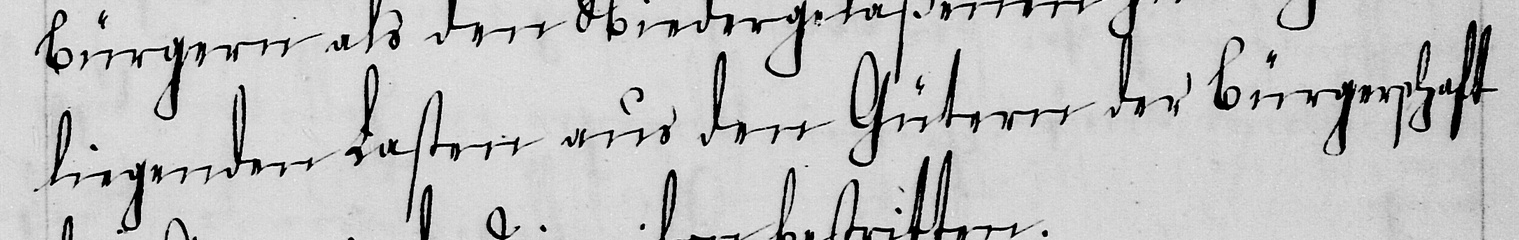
liegenden Lasten aus den Gütern der Bürgerschaft
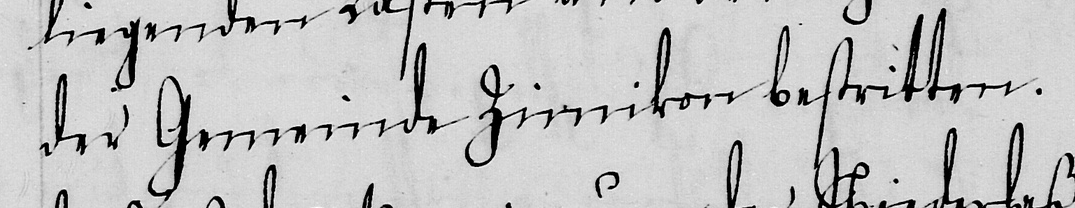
der Gemeinde Zimikon bestritten.
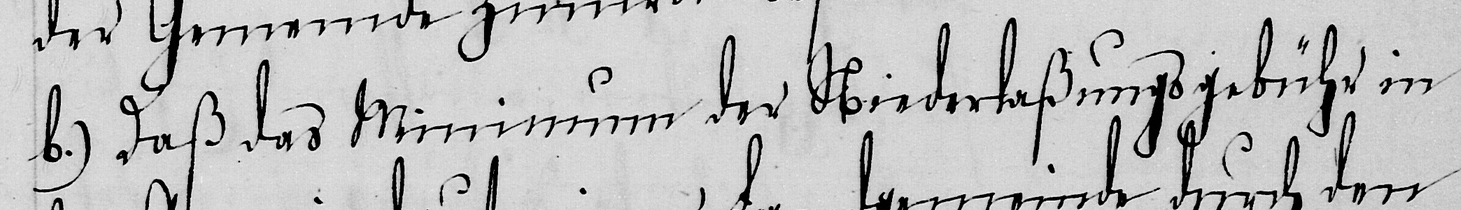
b.) Daß das Minimum der Niederlaßungsgebühr in
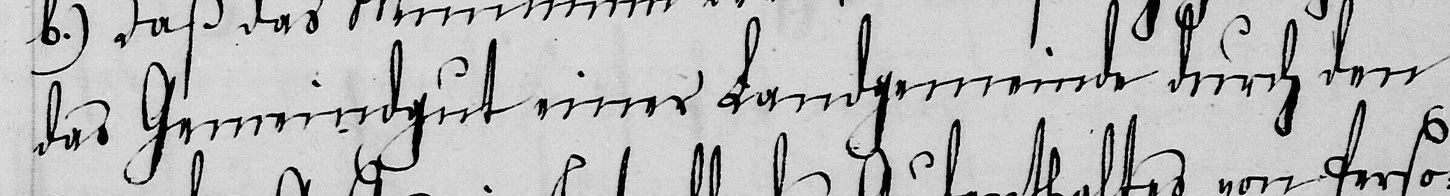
das Gemeindgut einer Landgemeinde durch den
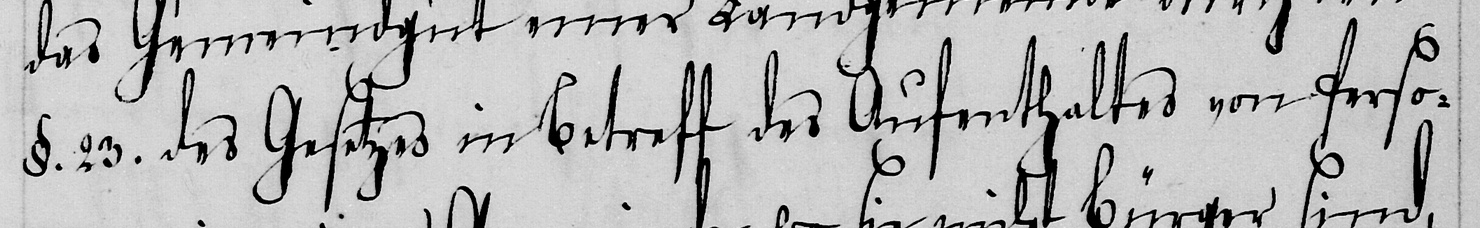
§. 23. des Gesetzes in Betreff des Aufenthaltes von Perso¬
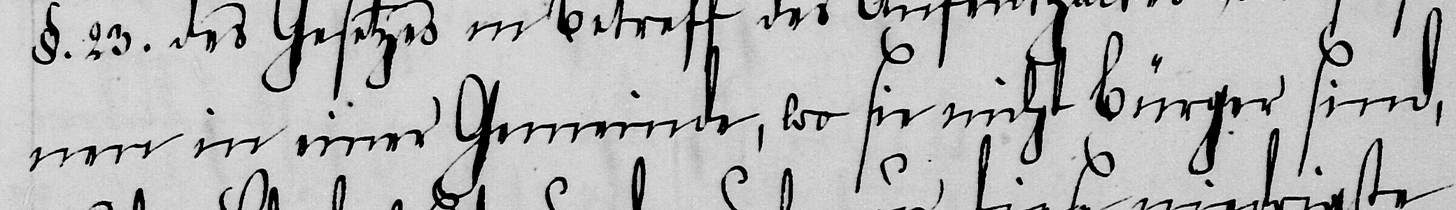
nen in einer Gemeinde, wo sie nicht Bürger sind,
